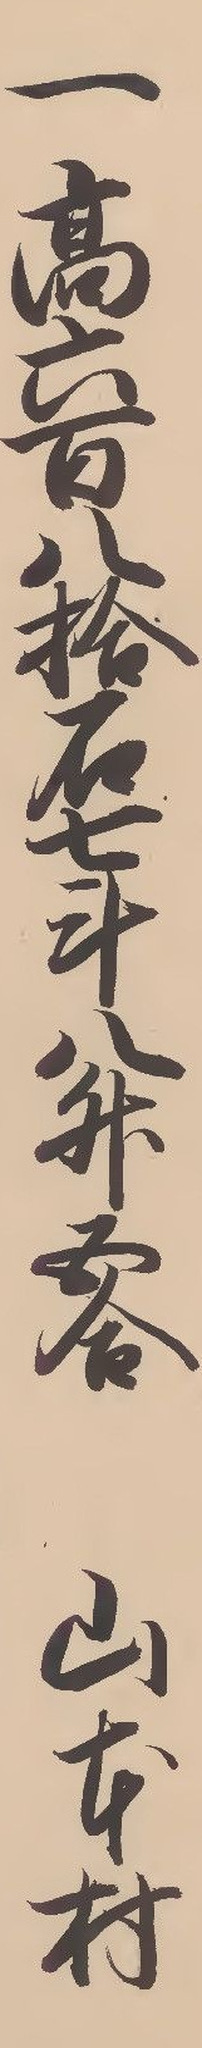一高六百八拾石七斗八升五合山本村
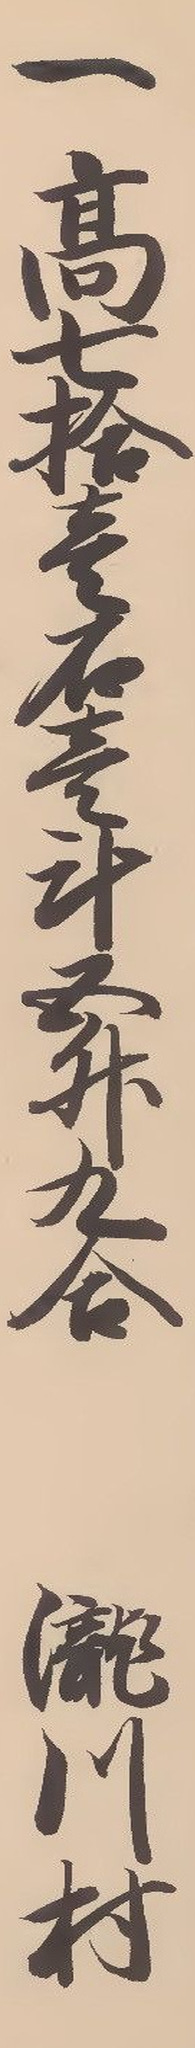一高七拾壱石壱斗五升九合滝川村
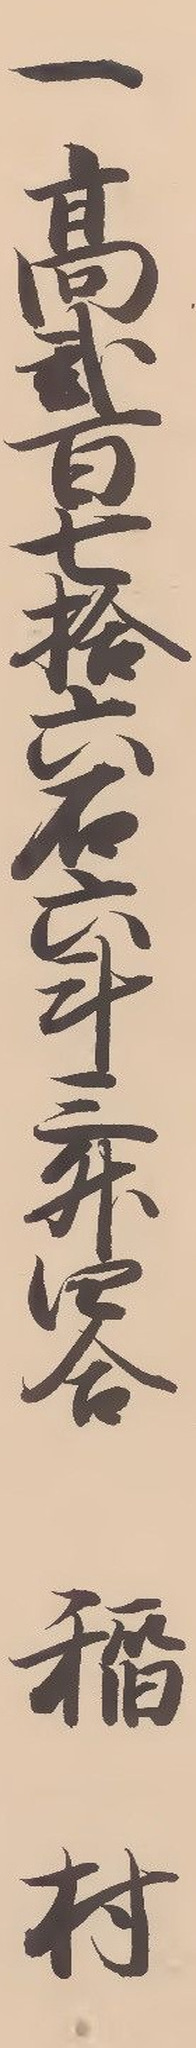一高弐百七拾六石六斗三升四合稲村
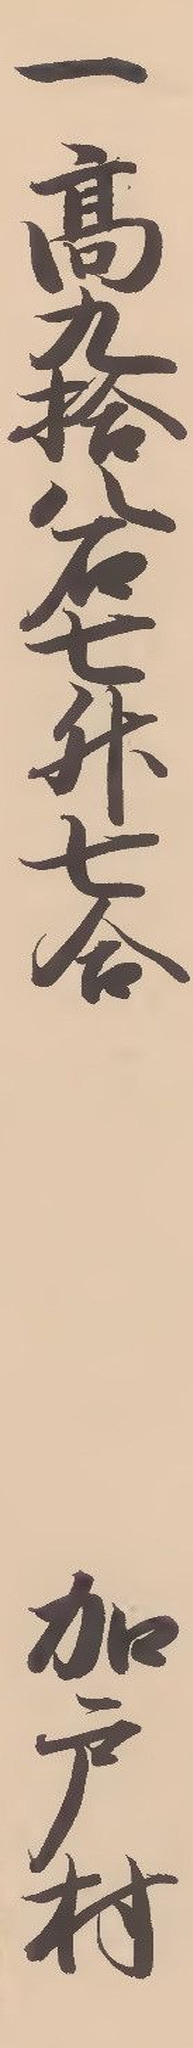一高九拾八石七升七合加戸村
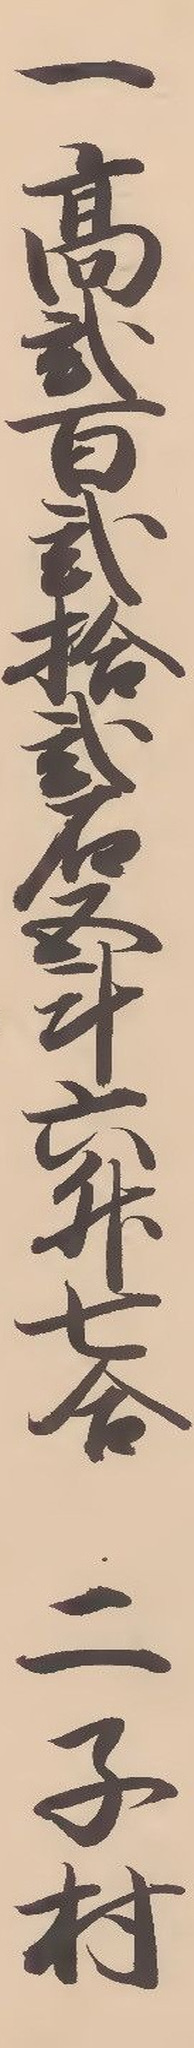一高弐百弐拾弐石五斗六升七合二子村

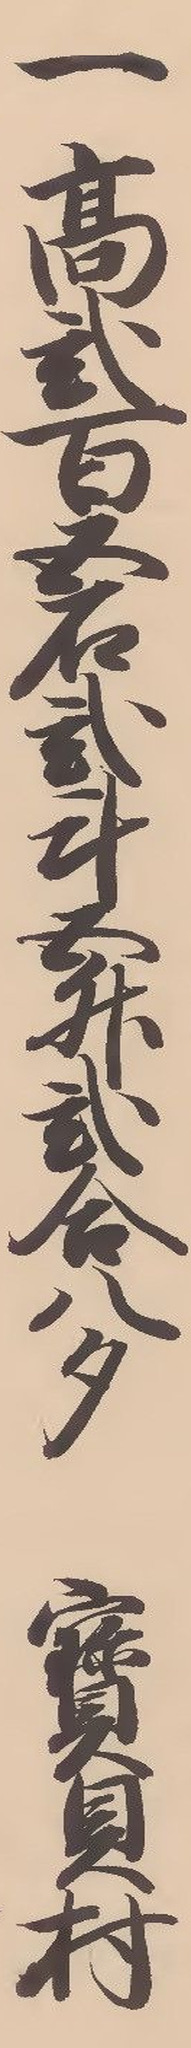一高弐百五石弐斗五升弐合八勺宝貝村
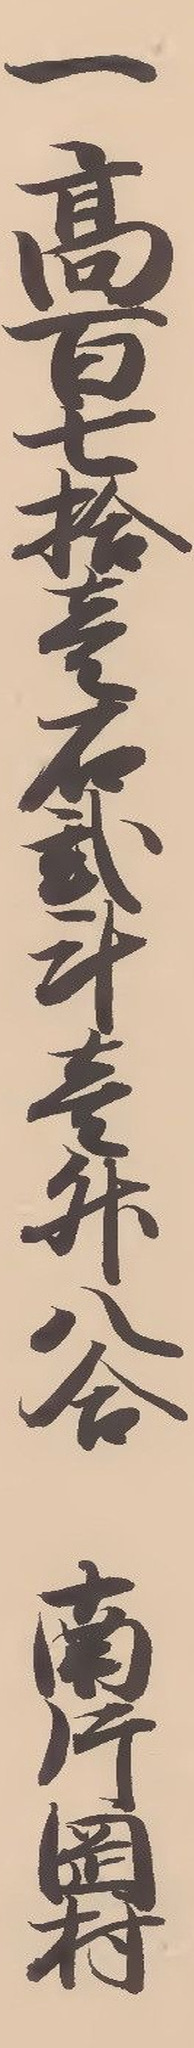一高百七拾壱石弐斗壱升八合南片岡村
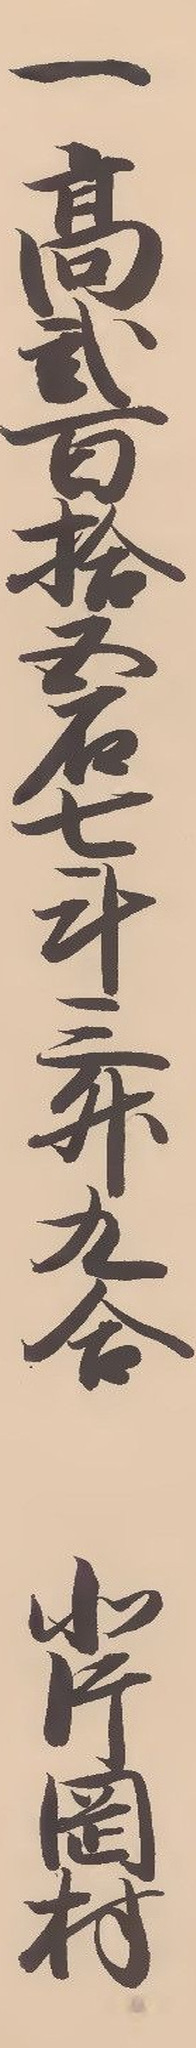一高弐百拾五石七斗三升九合北片岡村
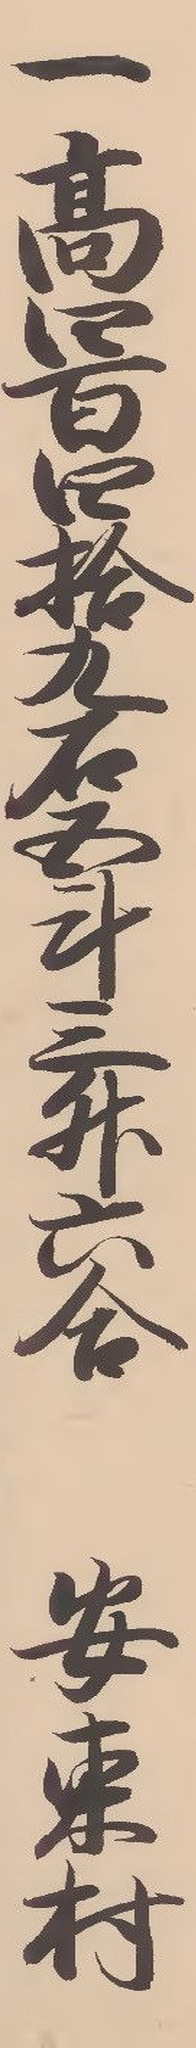一高四百四拾九石五斗三升六合安東村
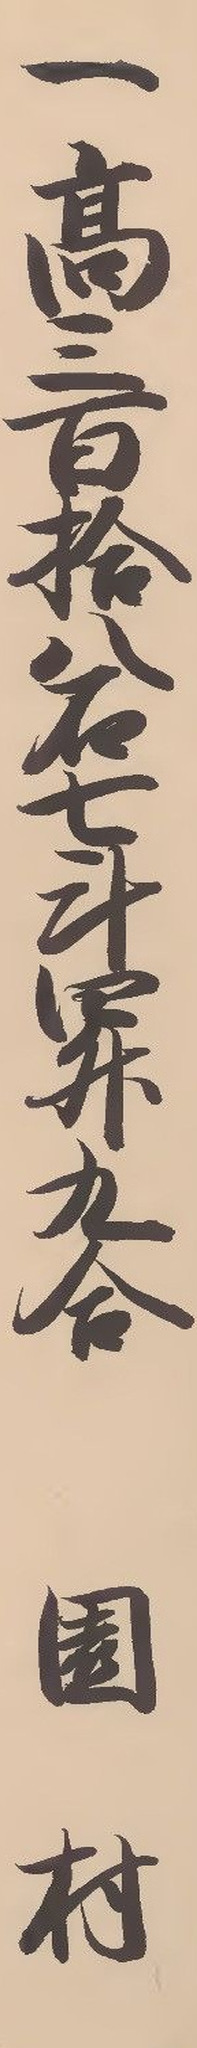一高三百拾八石七斗四升九合園村
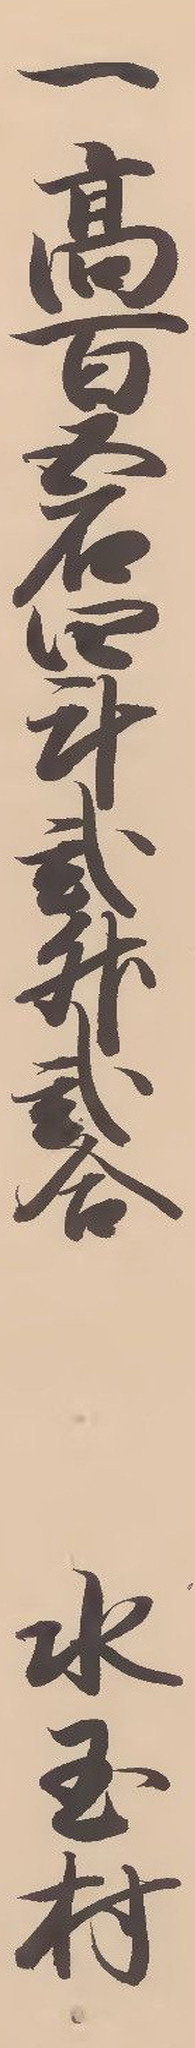一高百五石四斗弐升弐合水玉村
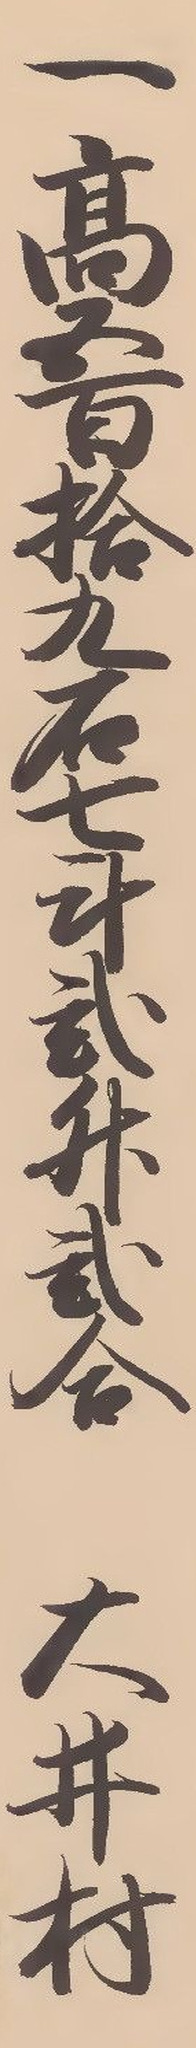一高五百拾九石七斗弐升弐合大井村
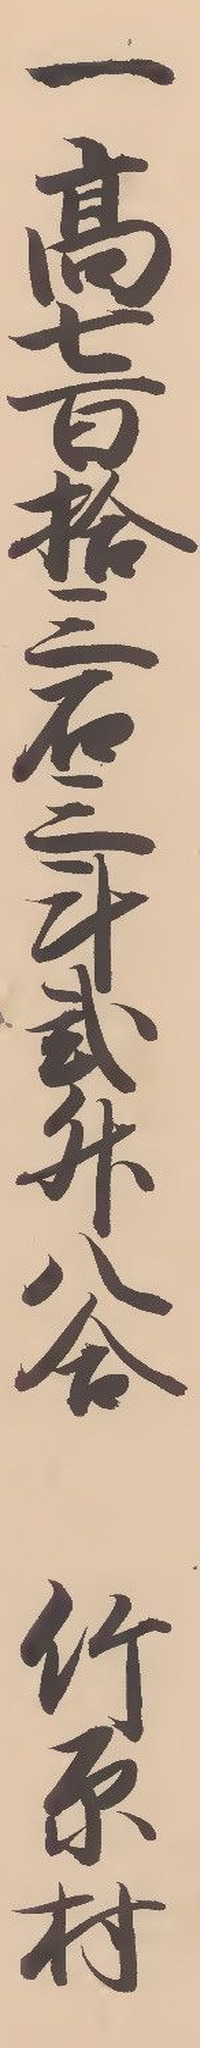一高七百拾三石三斗弐升八合竹原村

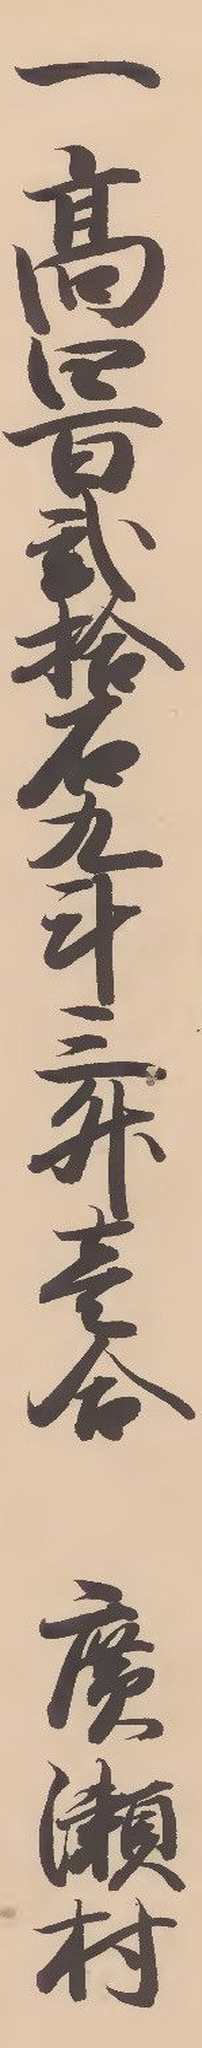一高四百弐拾石九斗三升壱合広瀬村
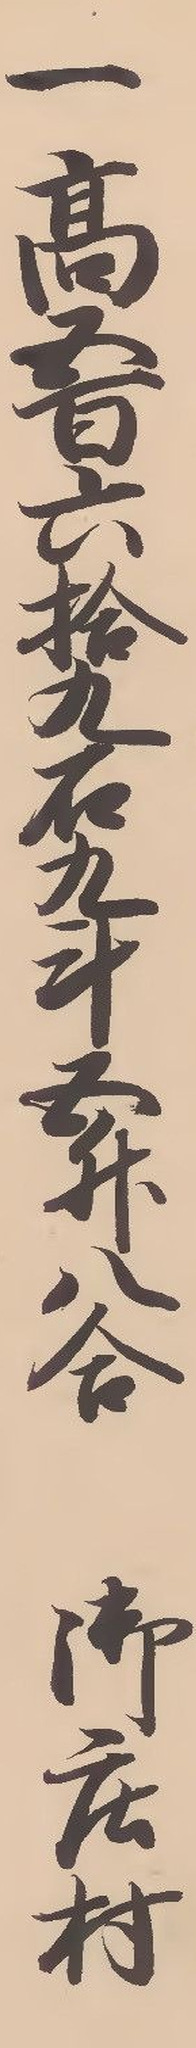一高五百六拾九石九斗五升八合御庄村
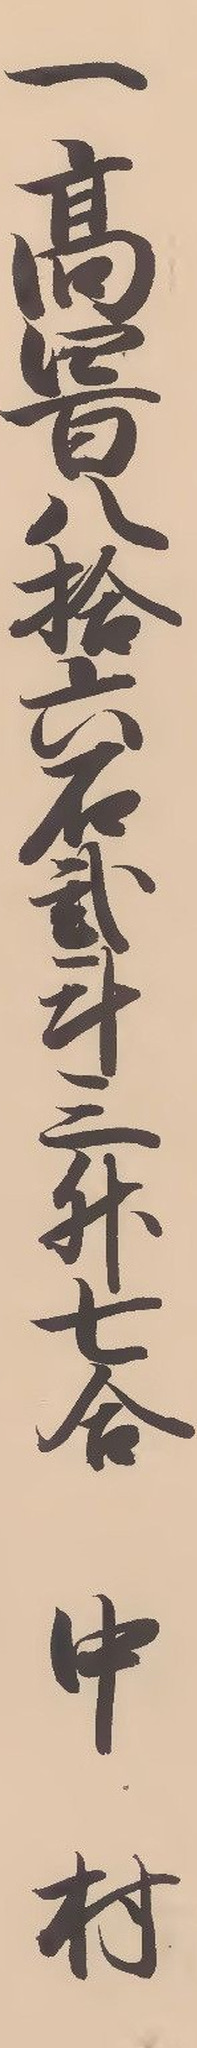一高四百八拾六石弐斗三升七合中村
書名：安房国郷帳
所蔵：国立公文書館 National Archives of Japan
